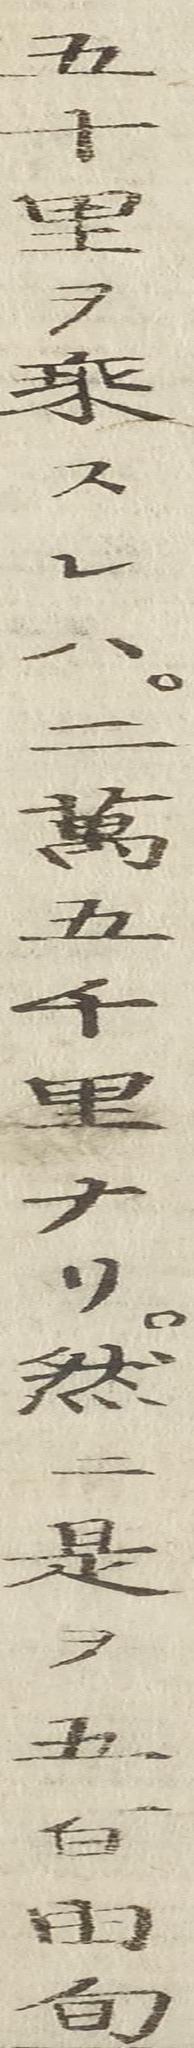五十里ヲ乗スレハ。二万五千里ナリ。然ニ是ヲ五百由旬

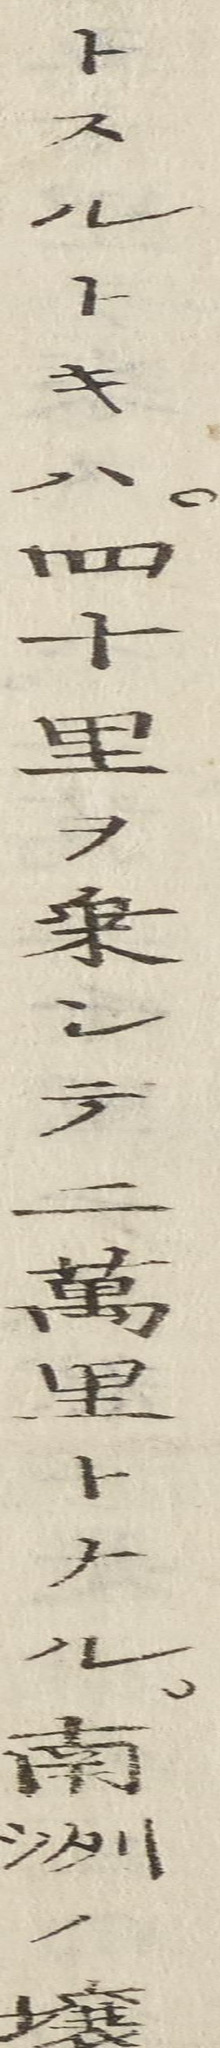トスルトキハ。四十里ヲ乗シテ二万里トナル。南洲ノ壌
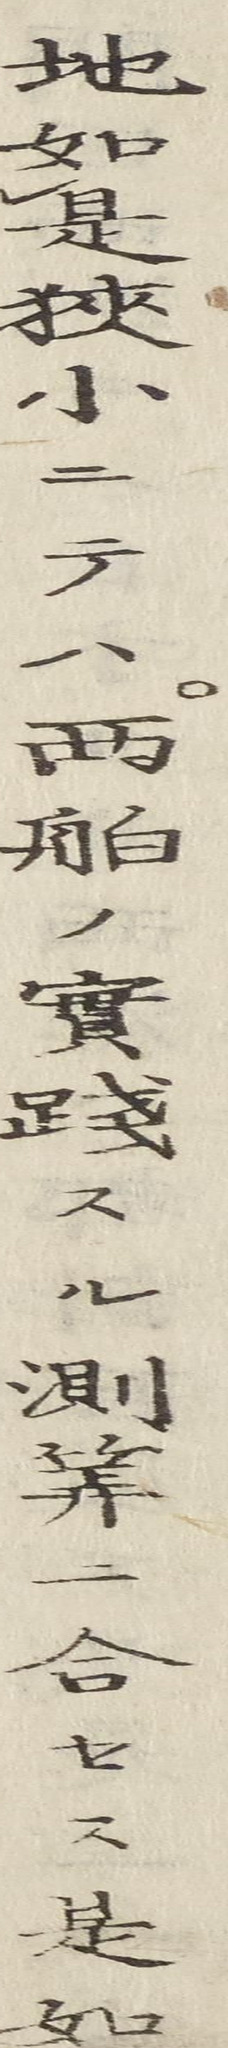地如是狭小ニテハ。西舶ノ実践スル測筭一合セス是如
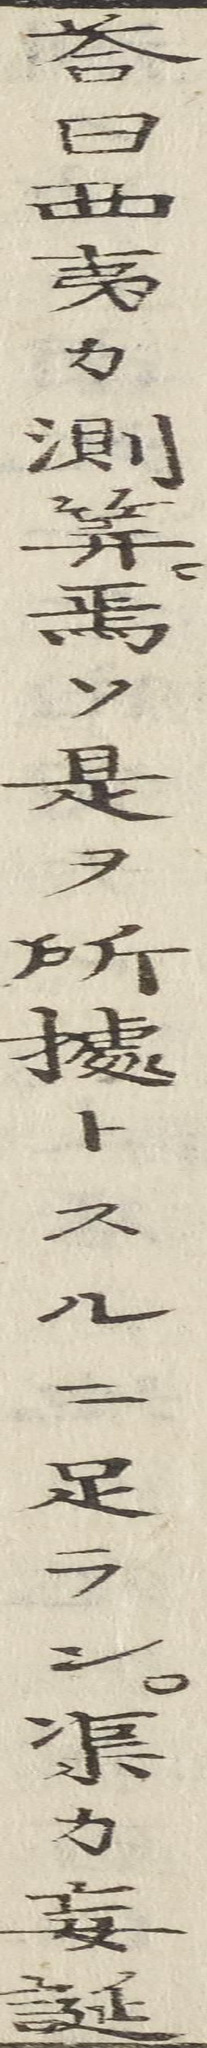答曰西夷カ測筭。焉ソ是ヲ所拠トスルニ足ラン。渠カ妄誕
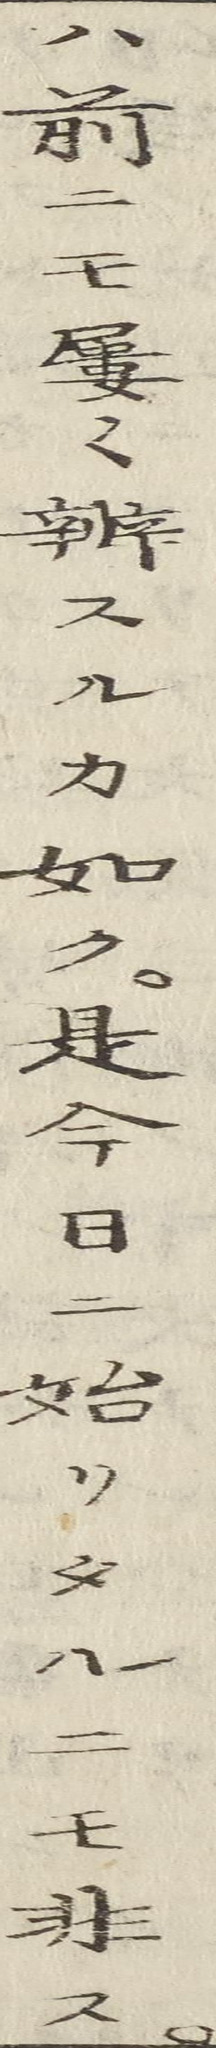ハ前ニモ屢〱弁スルカ如ク。是今日ニ始リタルニモ非ス。
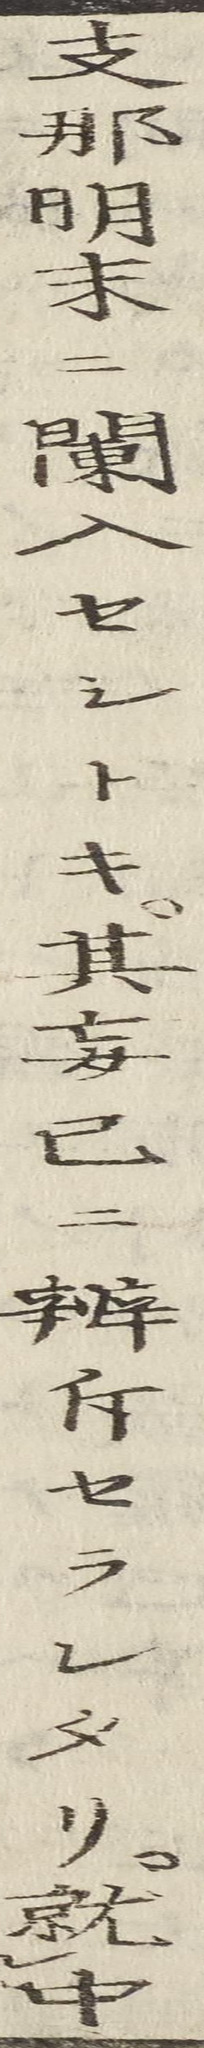支那明末ニ闌入セシトキ。其妄已ニ弁斥セラレタリ。就中
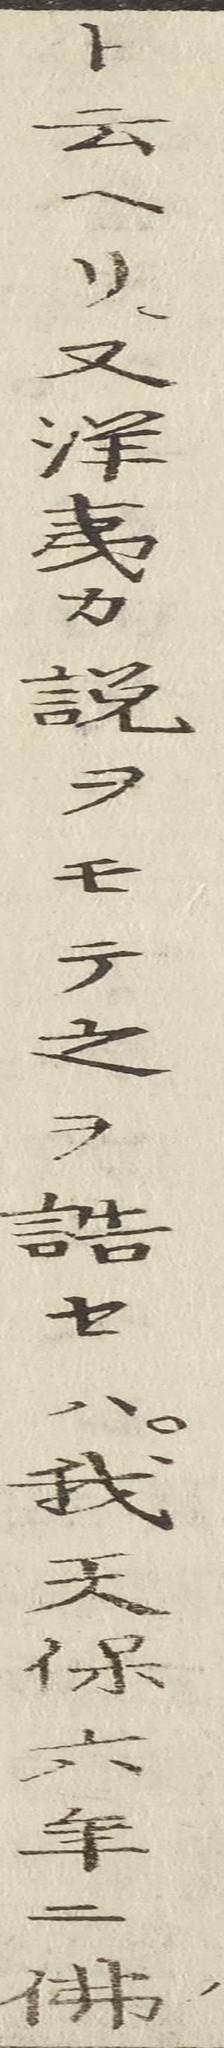ト云ヘリ。又洋夷カ説ヲモテ之ヲ誥セハ。我天保六年ニ仏
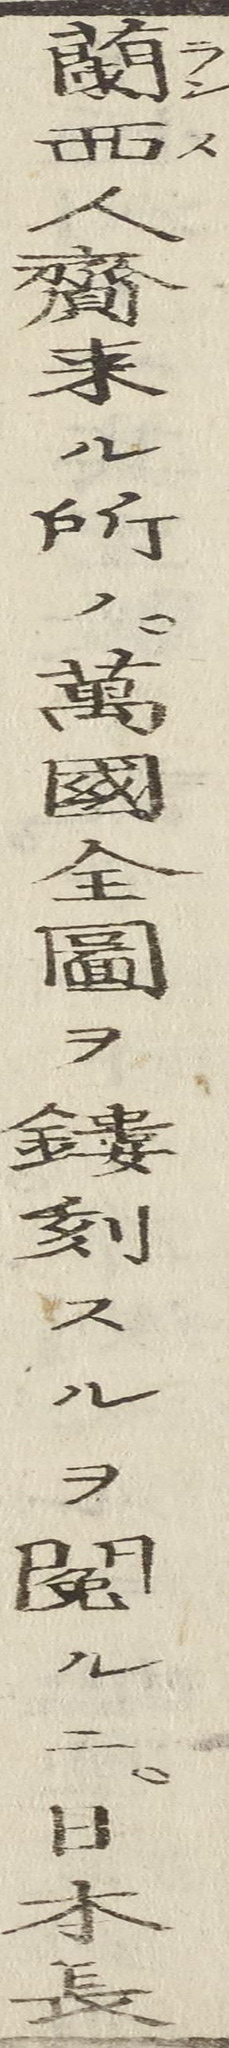蘭西人齎来ル所ノ。万国全図ヲ鏤刻スルヲ閲ルニ。日本長
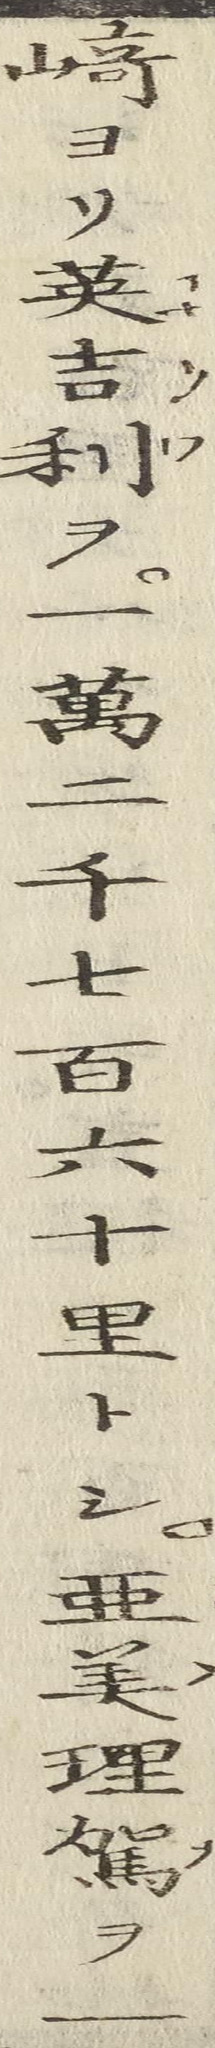崎ヨリ英吉利ヲ。一万二千七百六十里トシ。亜美理駕ヲ一
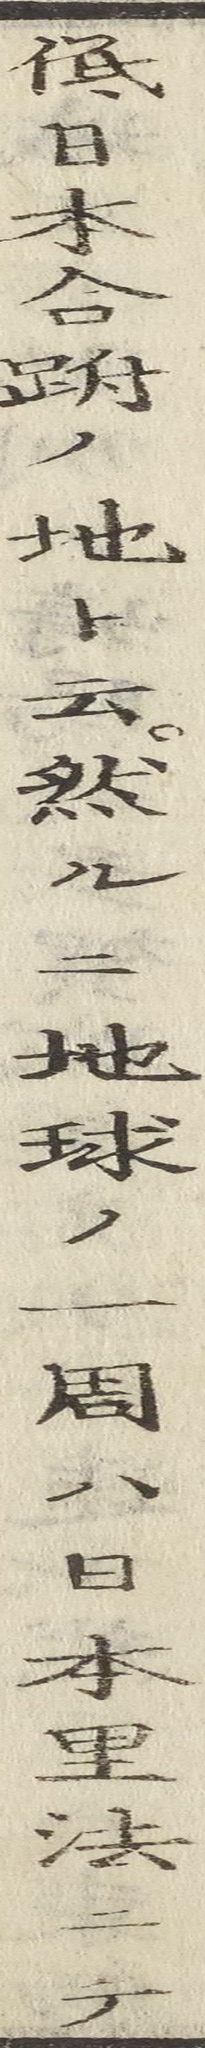低日本合跗ノ地ト云。然ルニ地球ノ一周ハ日本里法ニテ
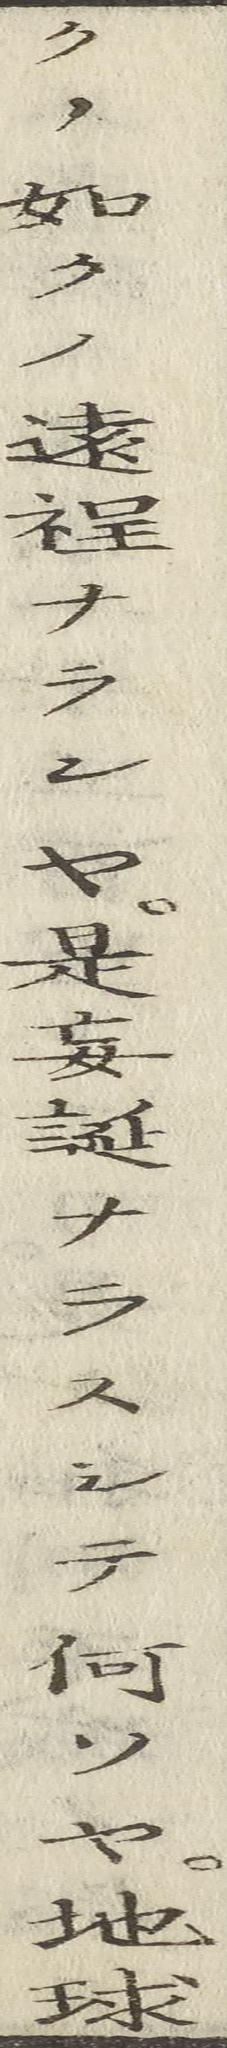クノ如クノ遠程ナランヤ。是妄誕ナラスシテ何ソヤ。地球
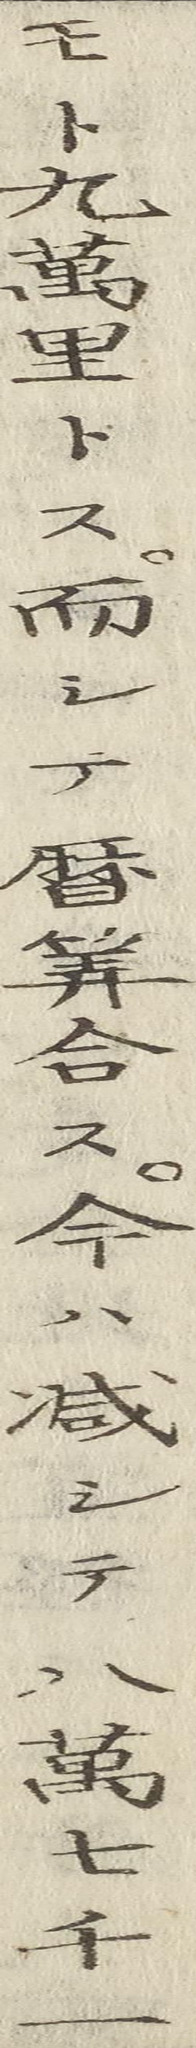モト九万里トス。而シテ暦筭合ス。今ハ減シテ八万七千一
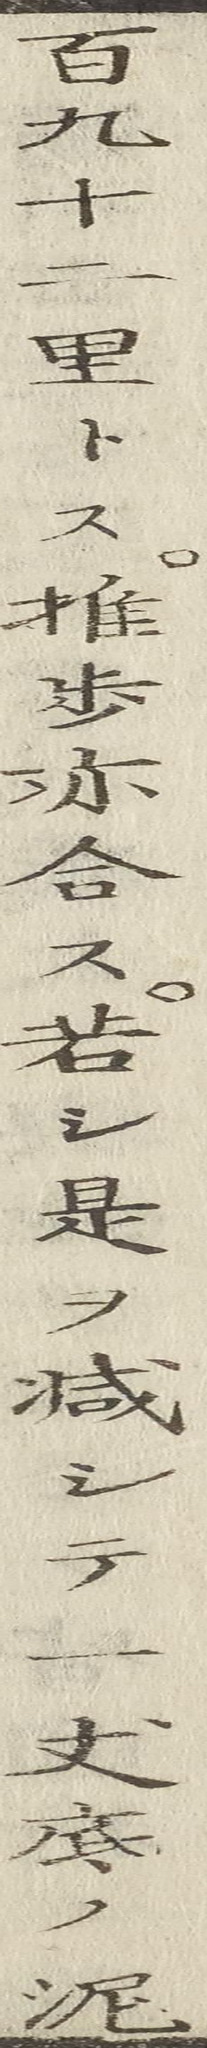百九十二里トス。推歩亦合ス。若シ是ヲ減シテ一丈底ノ泥
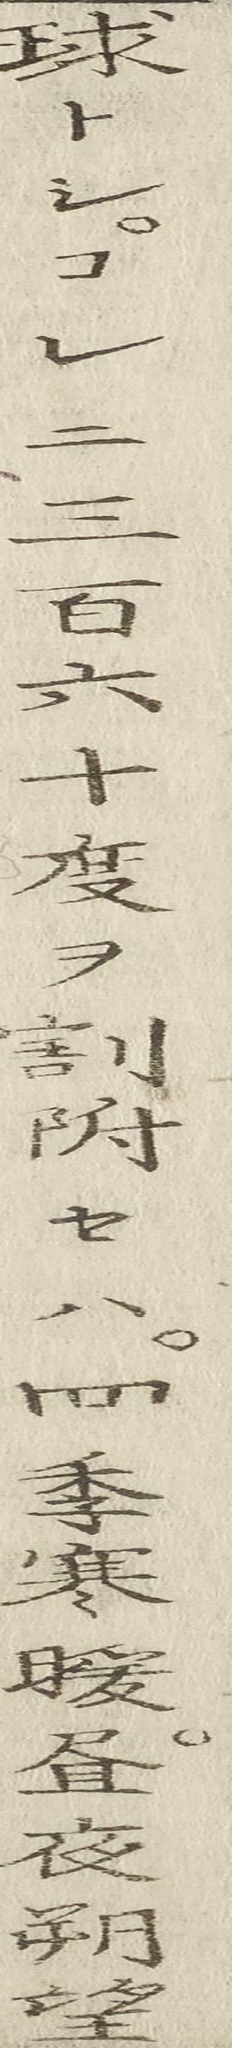球トシ。コレニ三百六十度ヲ割附セハ。四季寒暖。昼夜朔望
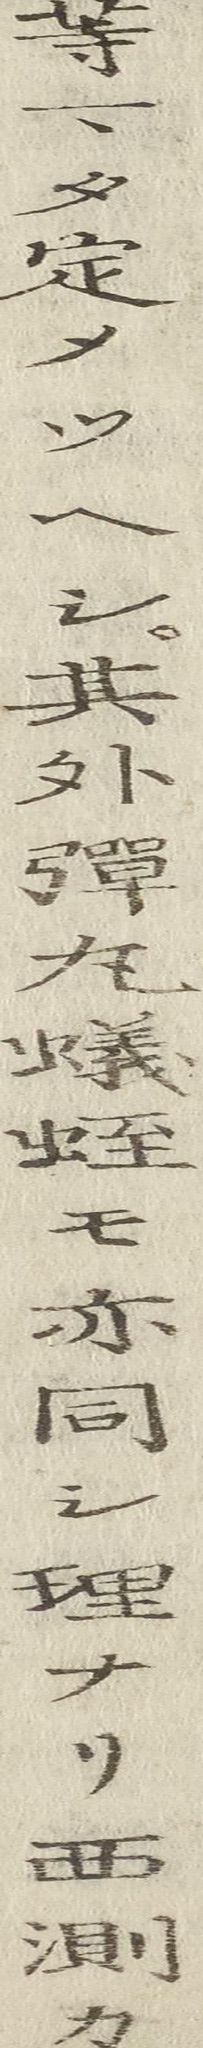等マタ定メツヘシ。其外弾丸蟻蛭モ亦同シ理ナリ西測カ
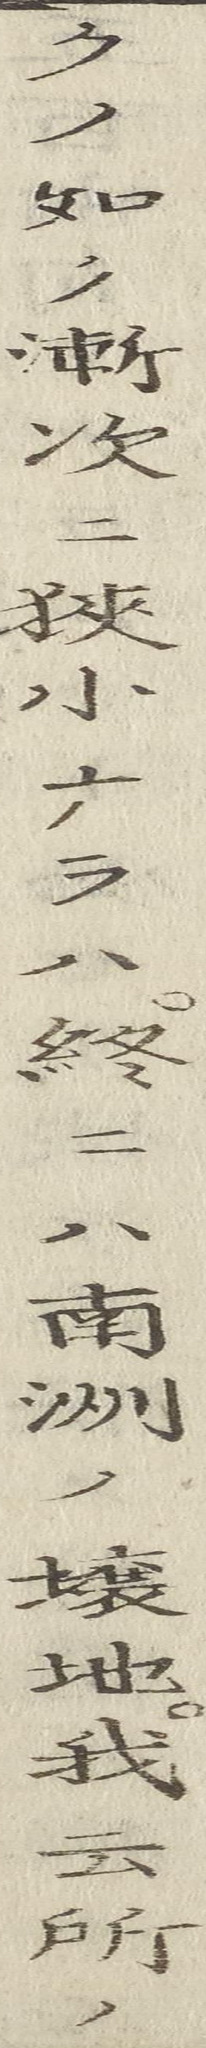クノ如ク漸次ニ狭小ナラハ。終ニハ南洲ノ壌地。我云所ノ
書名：護法新論　二編　中
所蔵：東京大学地震研究所図書室 Earthquake Research Institute Library, The University of Tokyo, JAPAN
